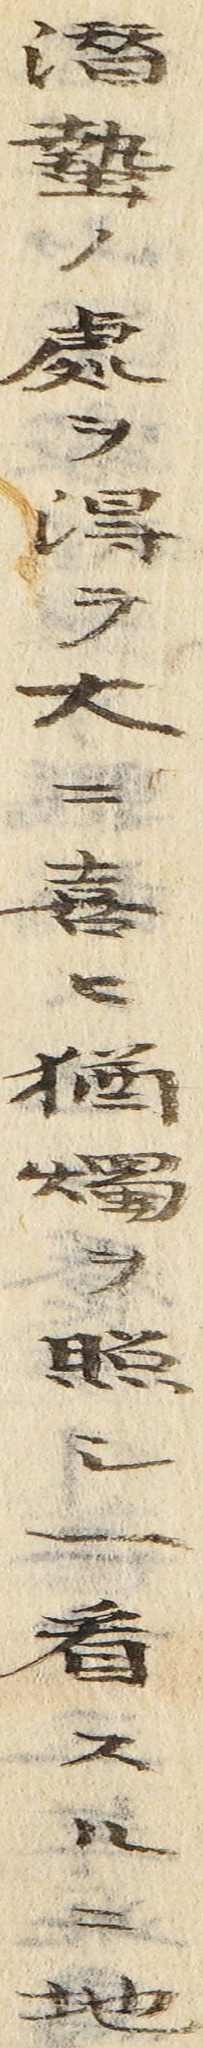潜蟄ノ処ヲ得テ大ニ喜ヒ猶燭ヲ照シ一看スルニ地
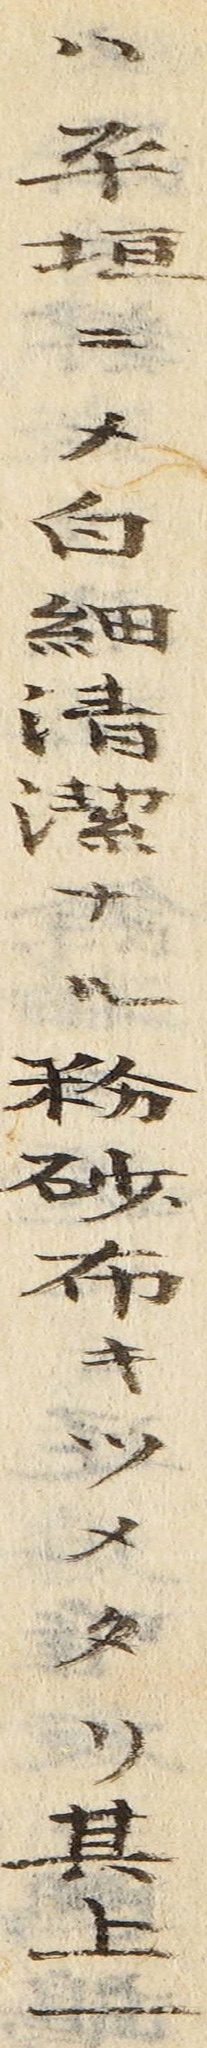ハ平坦ニシテ白細清潔ナル粉砂布キツメタリ其上一
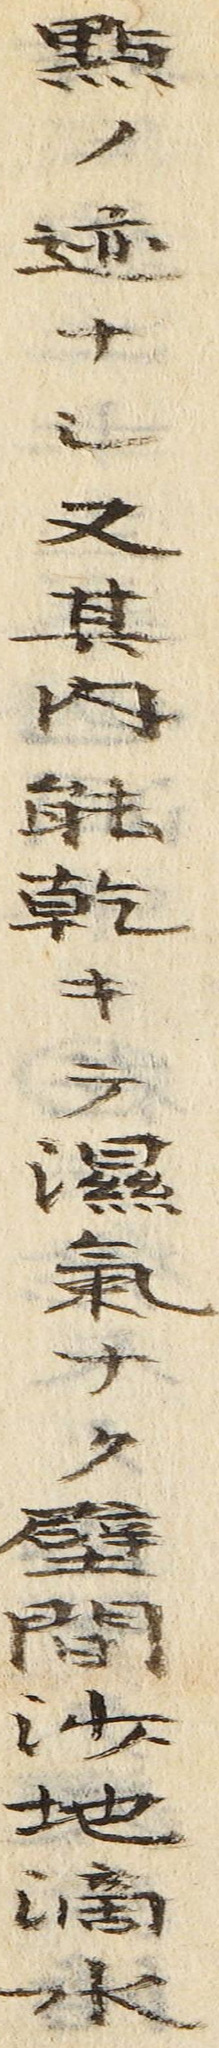点ノ迹ナシ又其内能乾キテ湿気ナク壁間沙地滴水
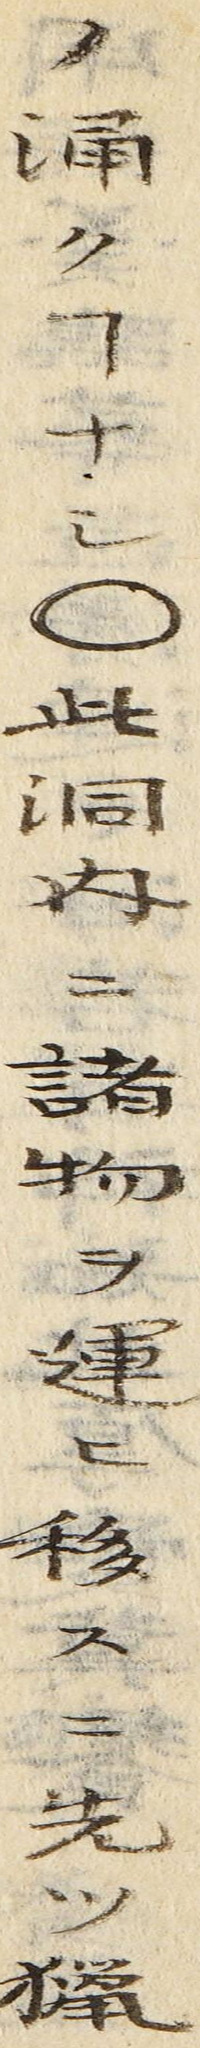ノ涌クコトナシ◯此洞内ニ諸物ヲ運ヒ移スニ先ツ猟
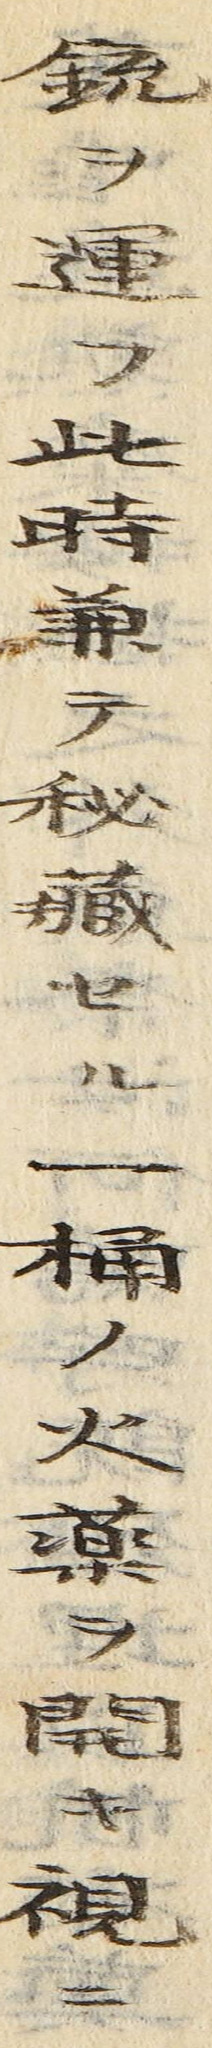銃ヲ運フ此時兼テ秘蔵セル一桶ノ火薬ヲ開キ視ニ
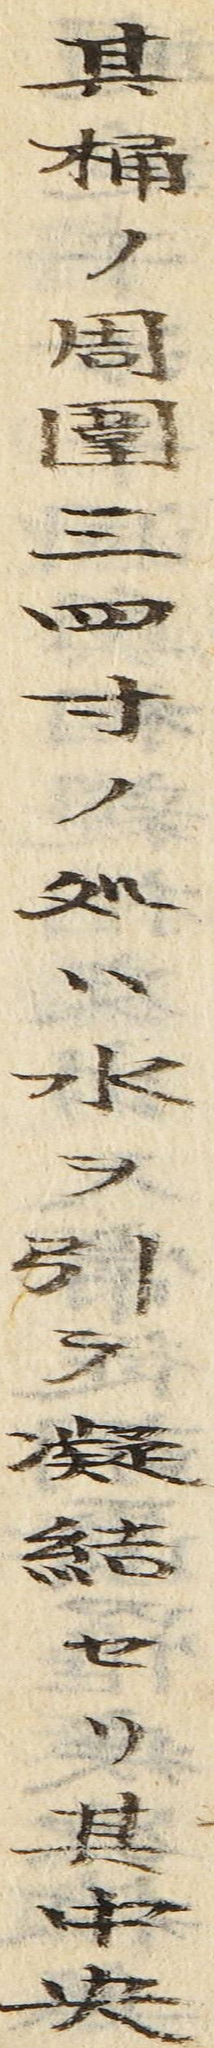其桶ノ周囲三四寸ノ処ハ水ヲ引テ凝結セリ其中央
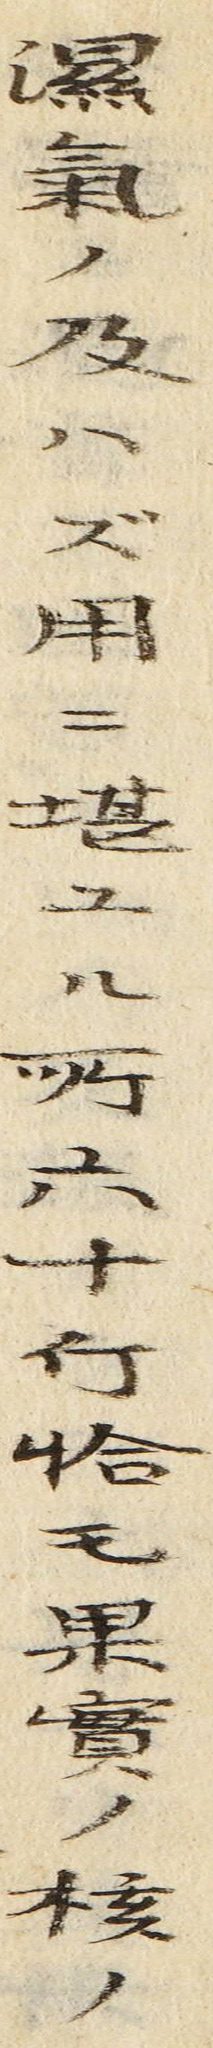湿気ノ及ハズ用ニ堪ユル所六十斤恰モ果実ノ核ノ
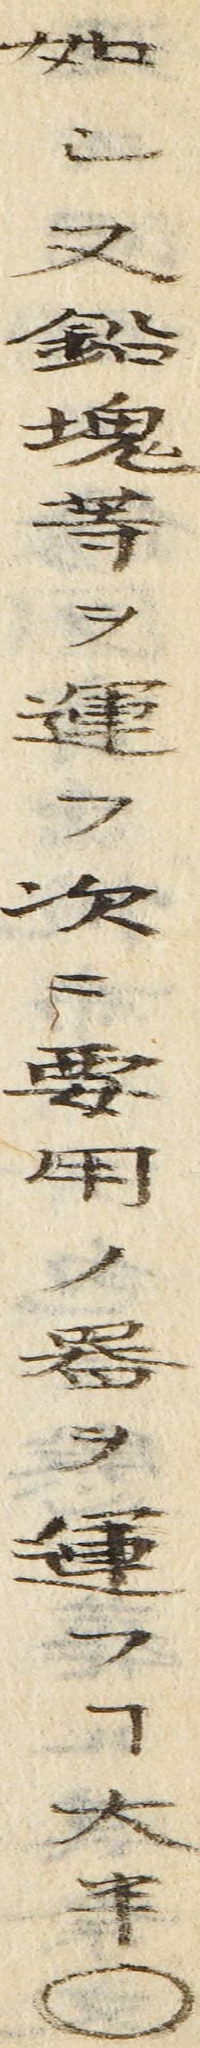如シ又鉛塊等ヲ運フ次ニ要用ノ器ヲ運フコト大半◯
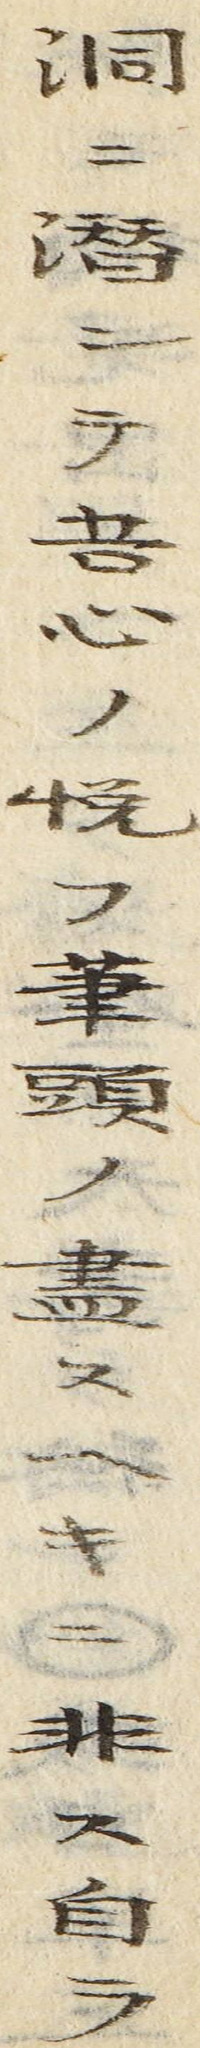洞ニ潜ンテ吾心ノ悦フ筆頭ノ尽スヘキニ非ス自ラ
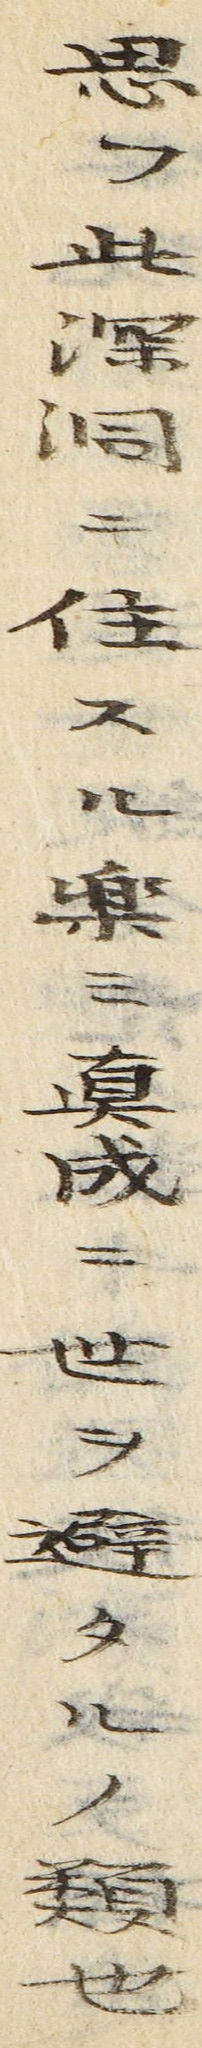思フ此深洞ニ住スル楽ミ真成ニ世ヲ避クルノ類也

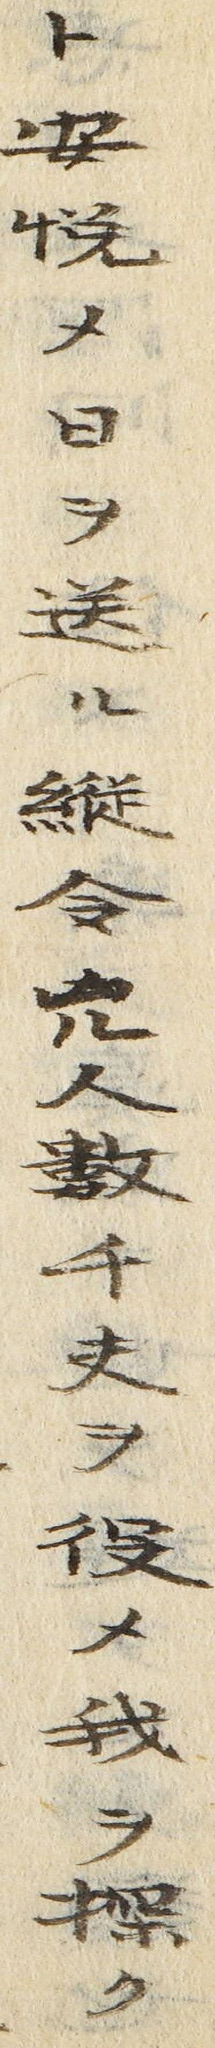ト安悦シテ日ヲ送ル縦令兇人数千夫ヲ役シテ我ヲ探ク
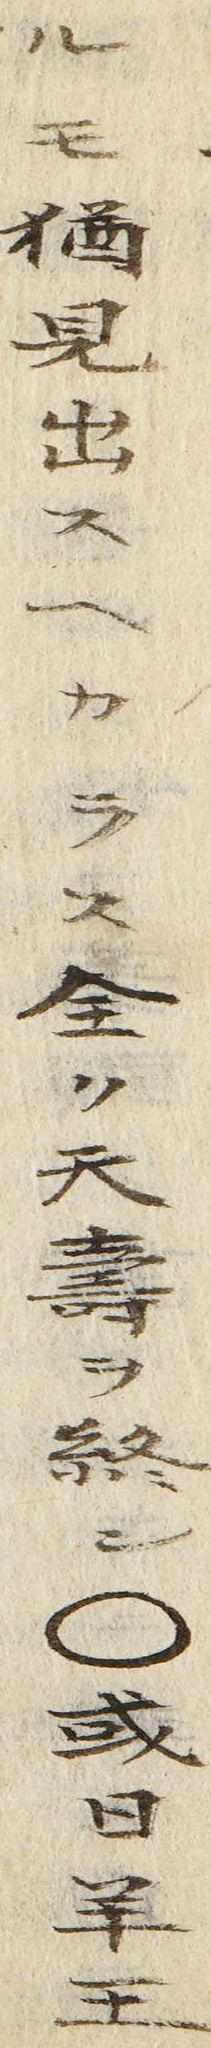ルモ猶見出スヘカラス全ク天寿ヲ終ン◯或日羊王
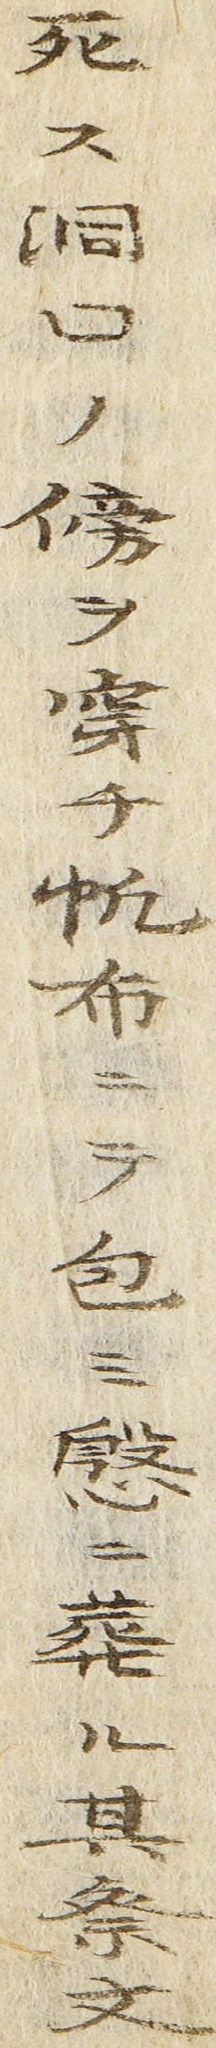死ス洞口ノ傍ヲ穿チ帆布ニテ包ミ慇ニ葬ル其祭文
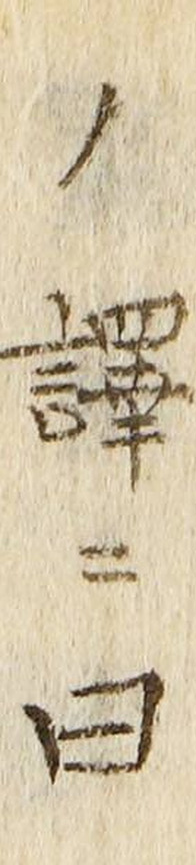ノ訳ニ曰
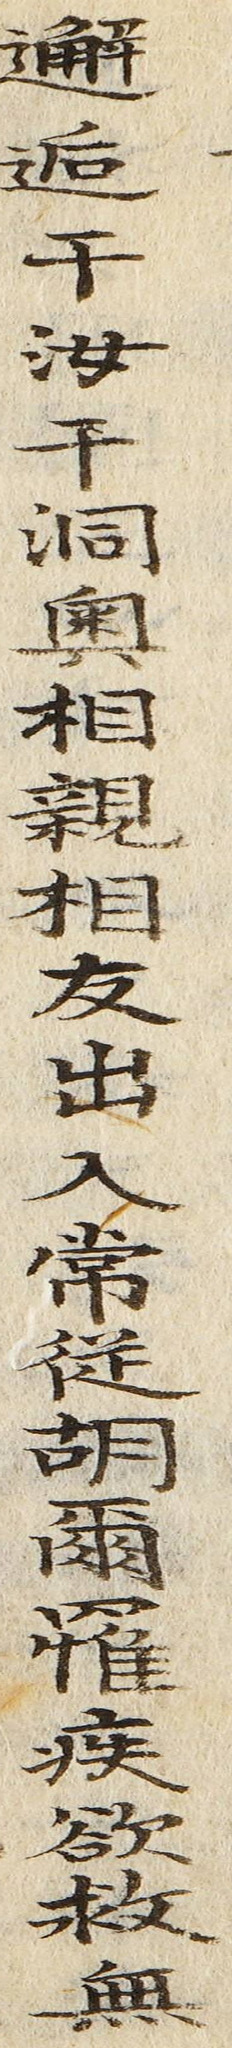邂逅于汝于洞奥相親相友出入常従胡爾罹疾欲救無
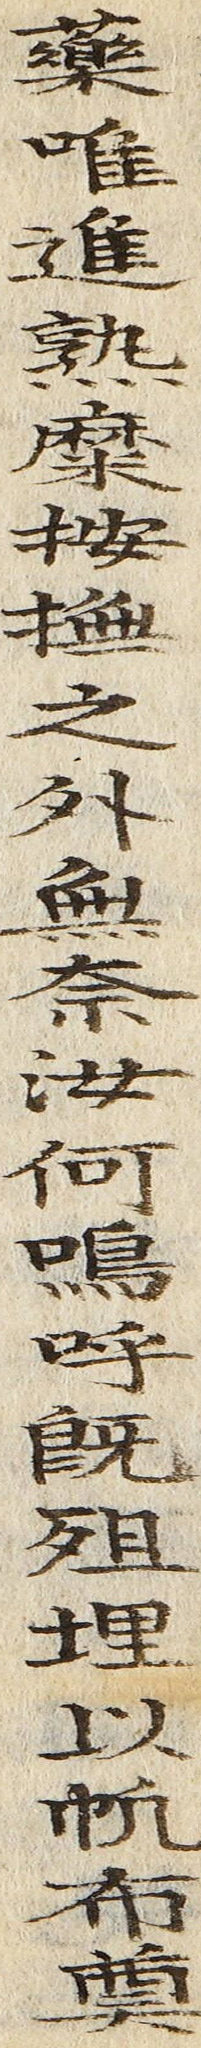薬唯進熟糜按撫之外無奈汝何嗚呼既殂埋以帆布奠
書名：漂流紀事
